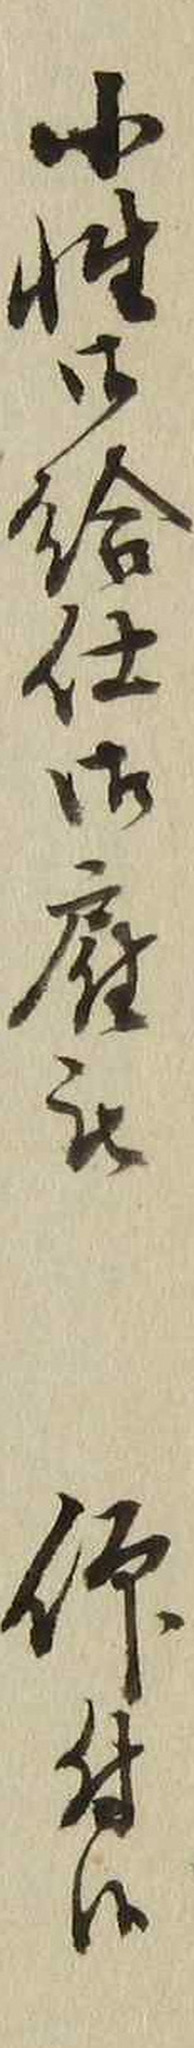小性御給仕御雇被仰付候
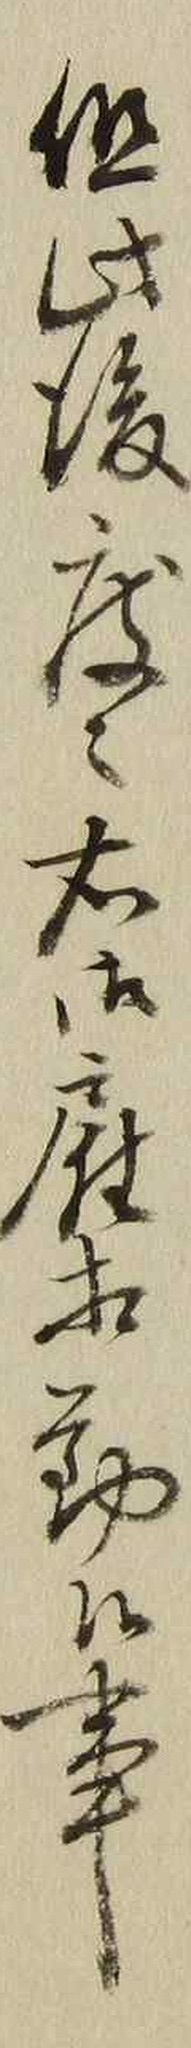但此後度々右御雇相勤候事
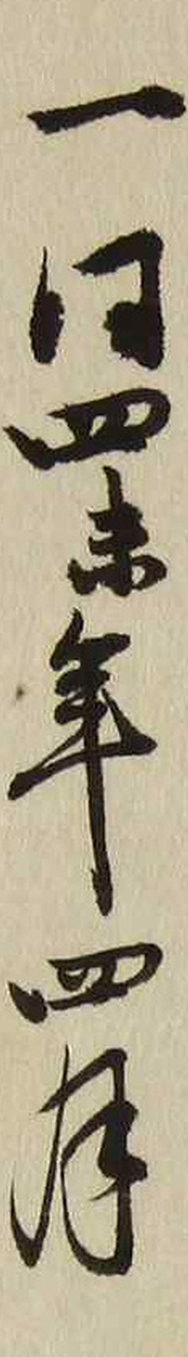一同四未年四月
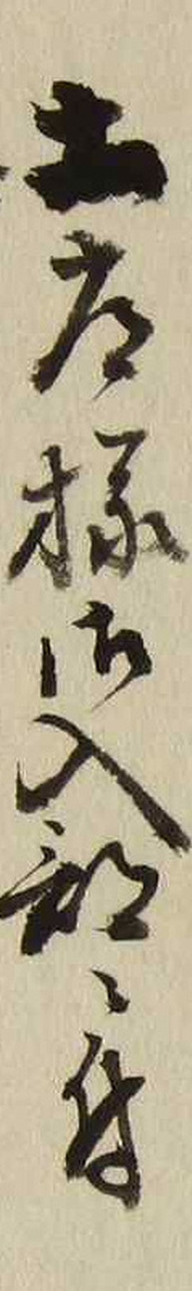土常様御入部ニ付
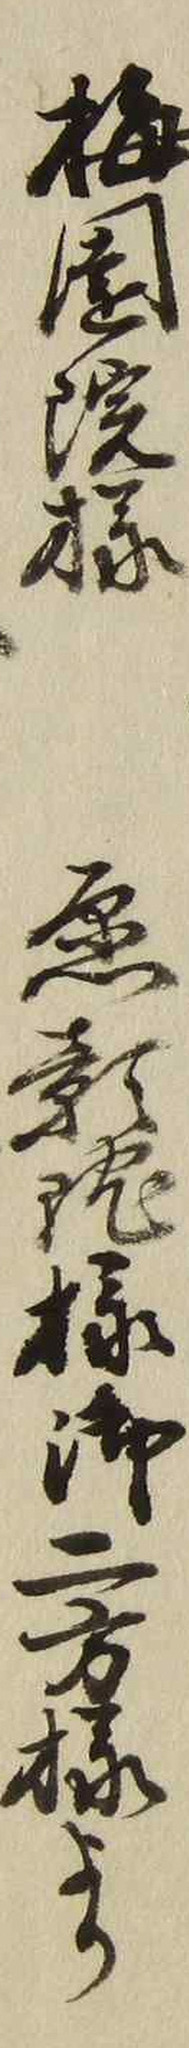梅園院様愿彰院様御二方様より
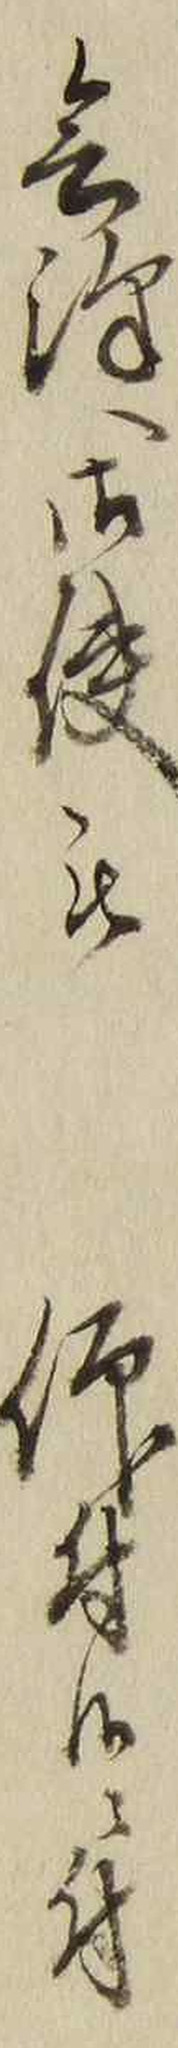会津へ御使被仰付候ニ付

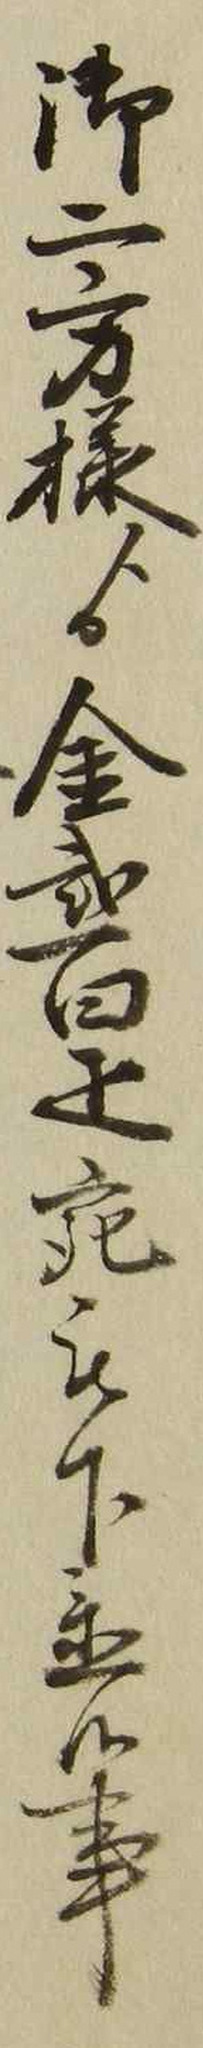御二方様ゟ金弐百疋宛被下置候事
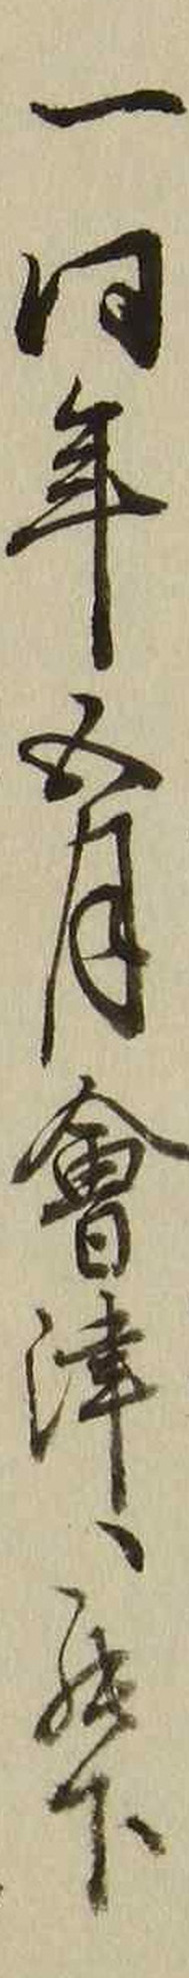一同年五月会津へ罷下
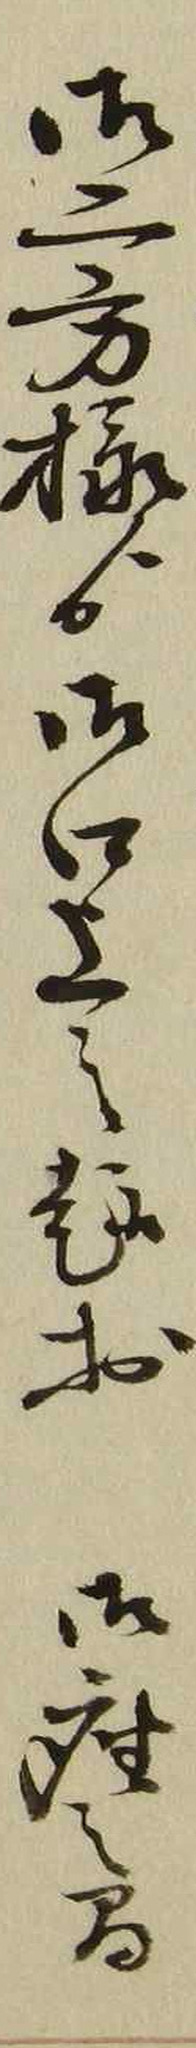御二方様ゟ御口上之趣於御座之間
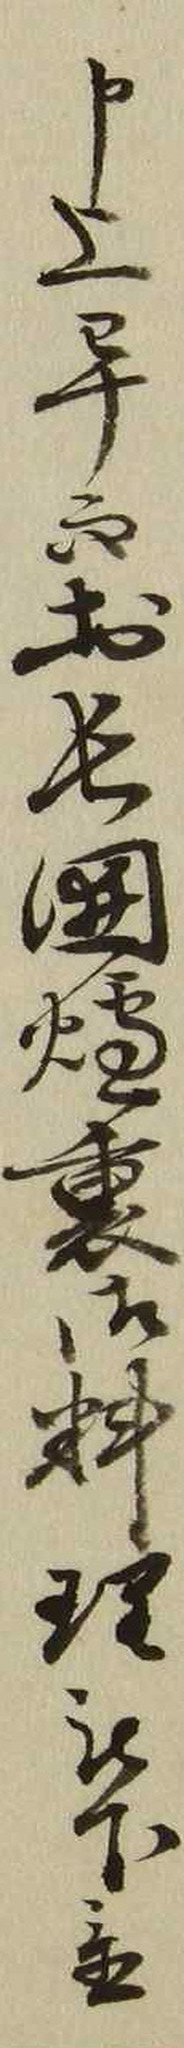申上畢而於長囲炉裏御料理被下置
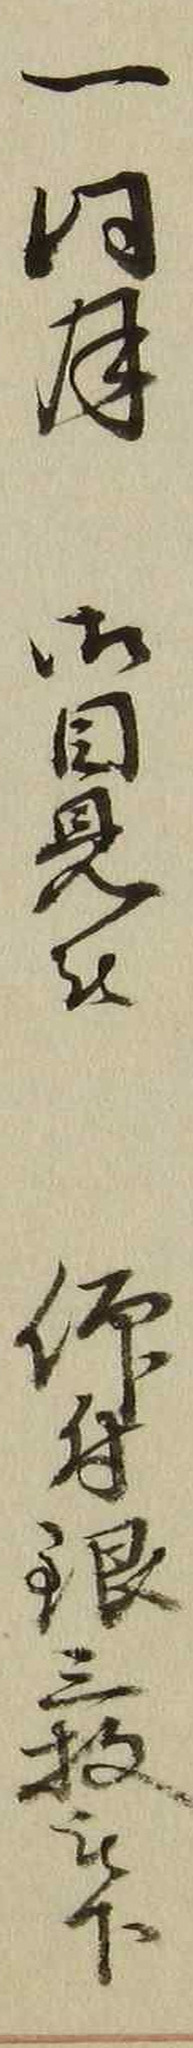一同月御目見被仰付銀三枚被下
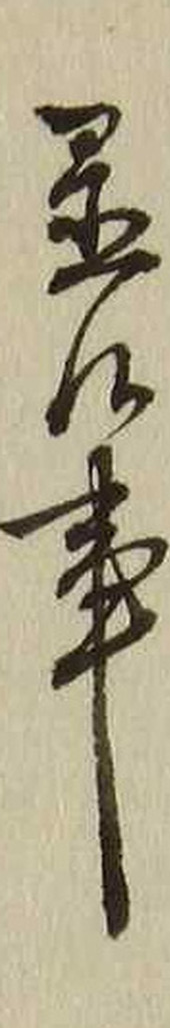置候事
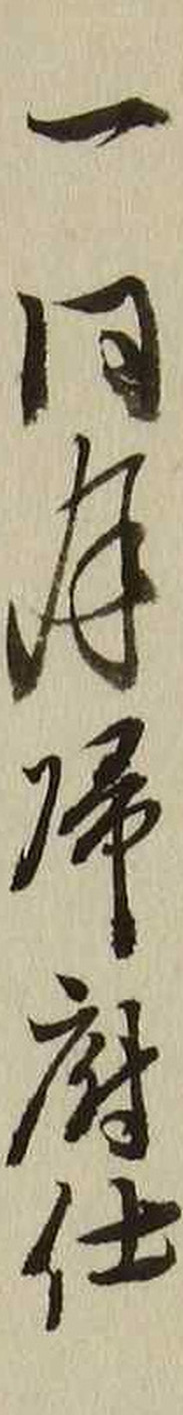一同月帰府仕
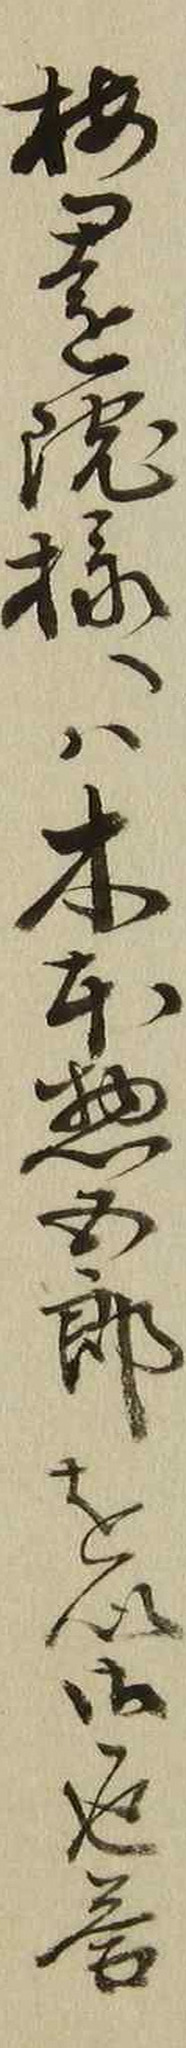梅園院様へハ木本惣五郎を以御返答
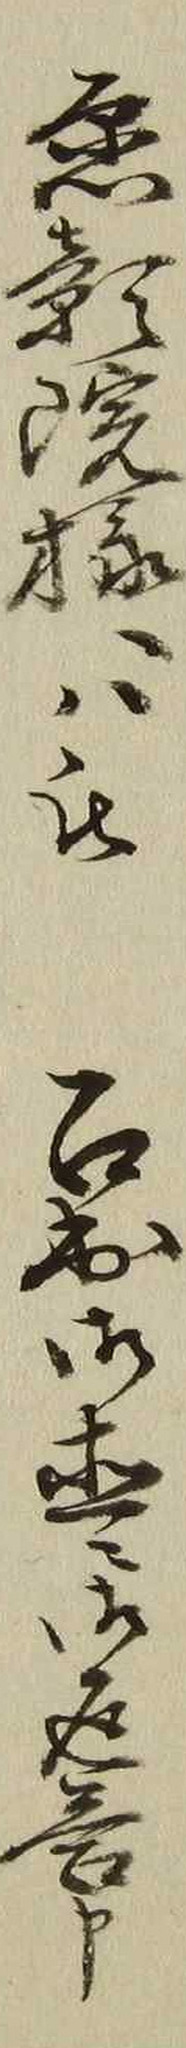愿彰院様へハ被召出御直ニ御返答申
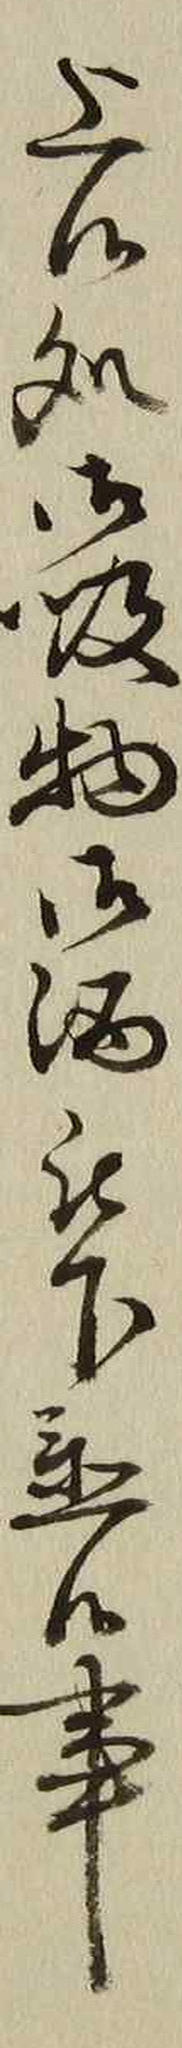上候処御吸物御酒被下置候事
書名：諸士系譜　巻之35　は之部3
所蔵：会津若松市立会津図書館
